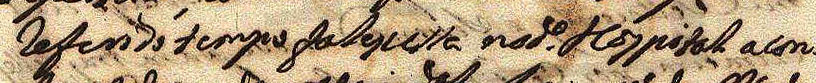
Referido tempo falescessa no d.o Hospital a con
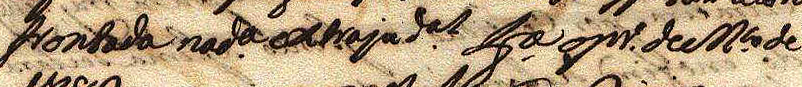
frontada na d.a extrajud.al Lx.a o pr.o de M.co de
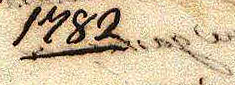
1782
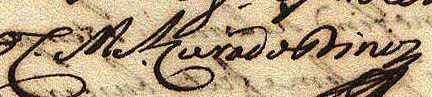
O P. M.el Curado Diniz
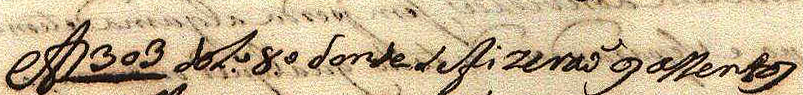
Fl 303 do L.o 8.o donde se fizeraõ os assentos
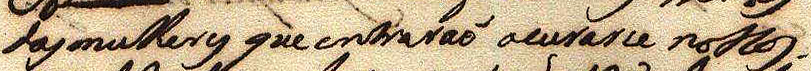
das mulheres que entraraõ a curarce no Hos
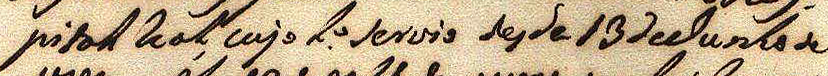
pital Real, cujo L.o servio desde 13 de Iunho de
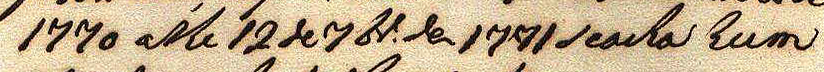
1770 athe 12 de 7bro. de 1771 se acha hum
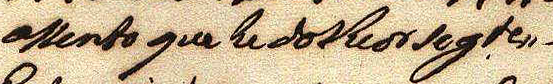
assento que he do theor seg.te
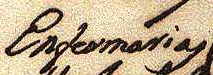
Enfermarias
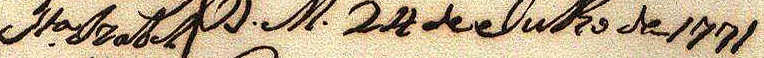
S.ta Izabel/ D. M. 24 de Iulho de 1771
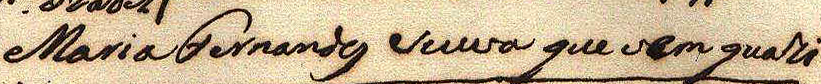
Maria Fernandes veuva que vem quazi
